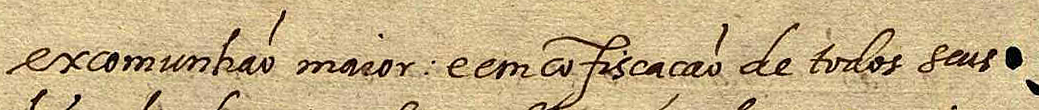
excomunhaõ maior: e em cōfiscaçaõ de todos seus
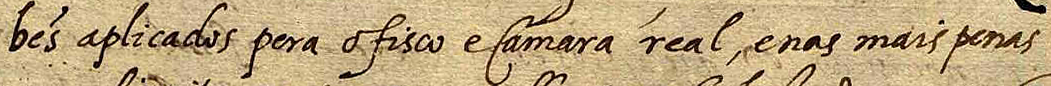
bes̄ aplicados pera o fisco e Camara real, e nas mais penas
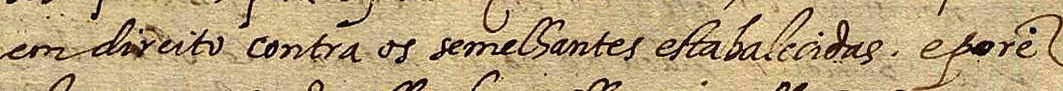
em direito contra os semelhantes estabalecidas. e porē
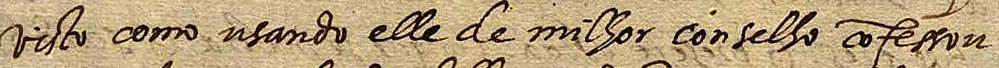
visto como usando elle de milhor conselho cōfessou
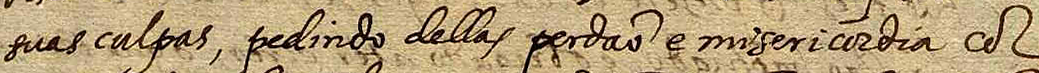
suas culpas, pedindo dellas perdaõ e misericordia cō
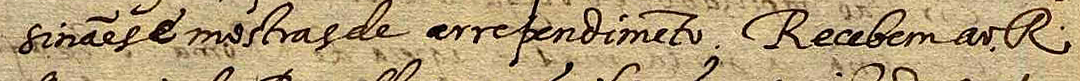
sināes e mostras de arrependimēto. Recebem ao R.
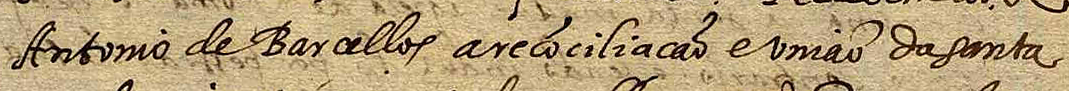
Antonio de Barcellos a recōciliacaõ e vniaõ da santa
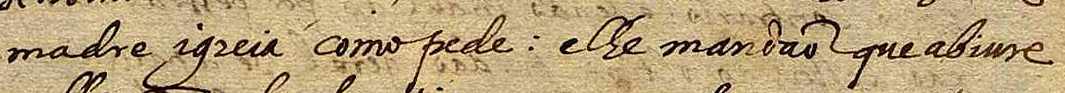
madre igreia como pede: e lhe mandaõ que abiure
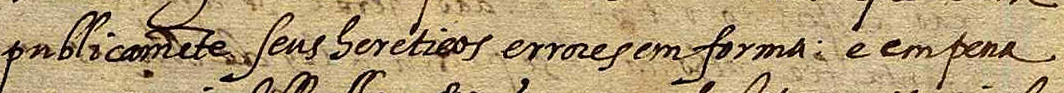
publicamēte seus hereticos errores em forma: e em pena
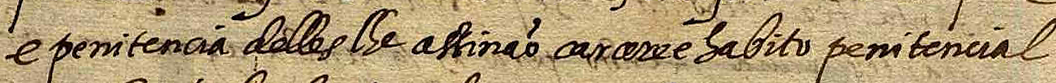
e penitençia delles lhe assinaõ carcere e habito penitencial
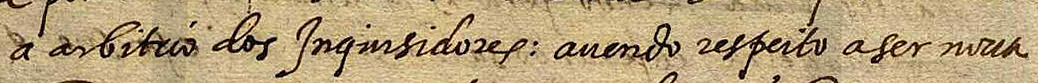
a arbitrio dos Jnquisidores: auendo respeito a ser noua
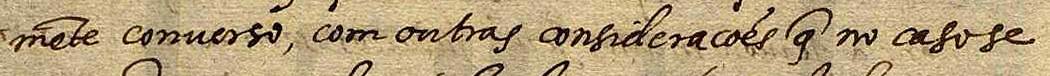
mēte conuerso, com outras consideraçoẽs q̄ no caso se
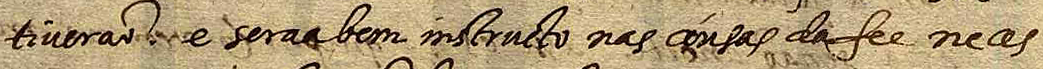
tiueraõ e sera a bem instructo nas cousas da fee neces
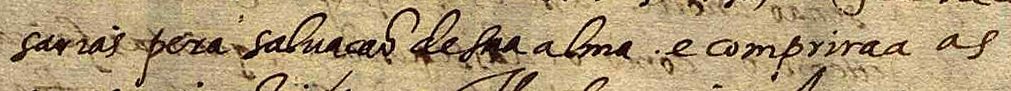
sarias pera saluaçaõ de sua alma. e compriraa as
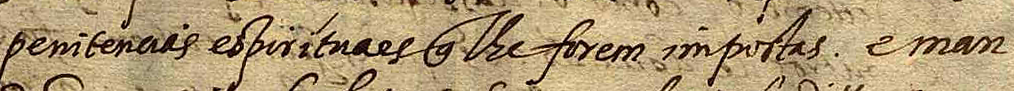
penitencias espirituaes q̄ lhe forem impostas. e man
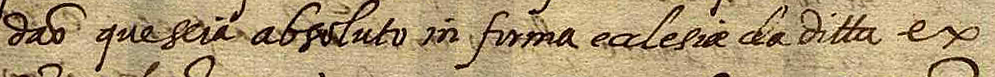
daõ que seia absoluto in forma ecclesiæ da ditta ex
